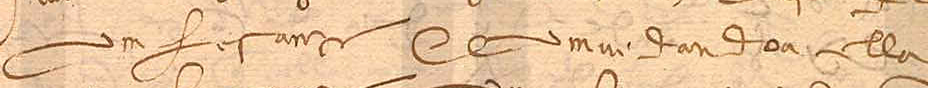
Comfesante e comuidandoa ella
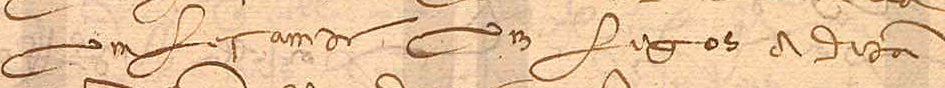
Comfesamte com figos A ditā
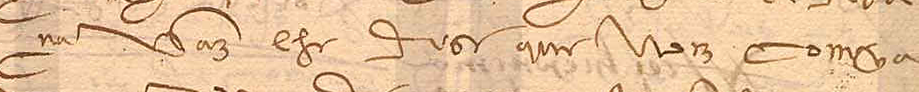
Cna Vāz lhe dise que Nom comya
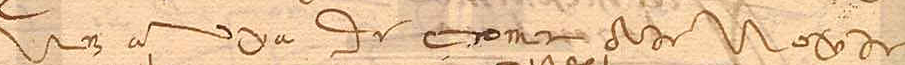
nem avya de comer Ate Noyte
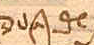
dia de
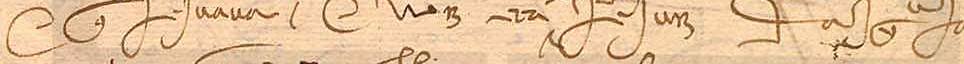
e q̄ JeJuaua / e nom era JeJum da JgrJa
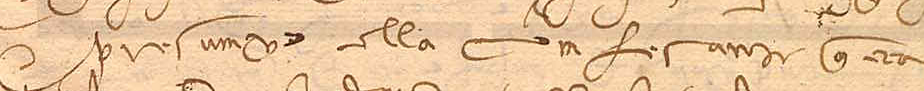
e presumyo ella comfesante q̄ era
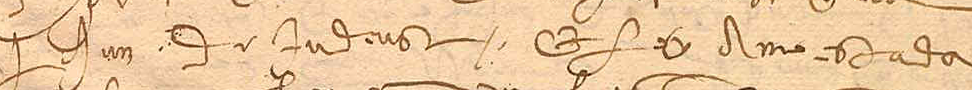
JeJum de Judeus /. E foy Amoestada
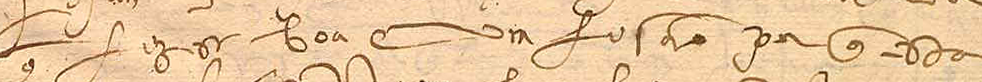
q̄ fizese boa Comfisão porq̄ esta
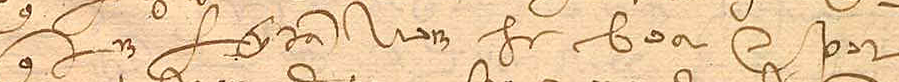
q̄ tem feyta nom he boa e por
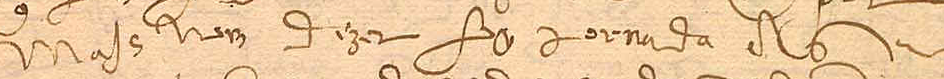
majs nom dizer foy tornada A seu
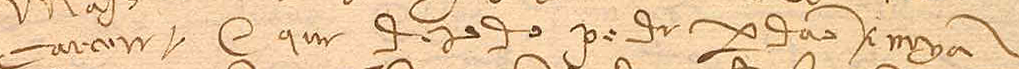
carcere / e que de todo pede ꝑdão e myā
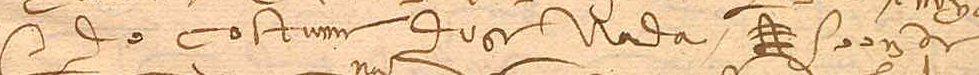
e do costume dise Nada / A soomte
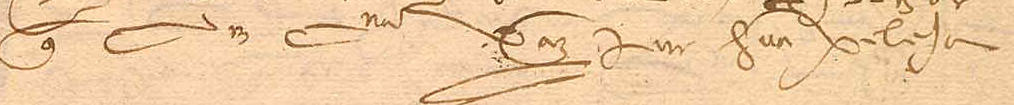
q̄ Com Cna Vāz tem hūa peleJa
